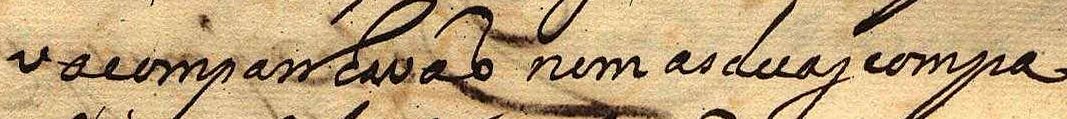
o acompanhavão, nem as duas compa
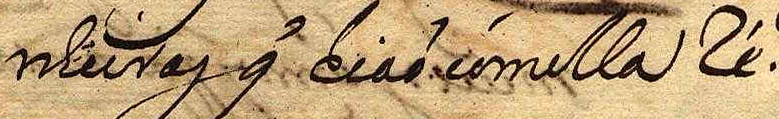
nheiras q̄ hiaõ com ella Ré.
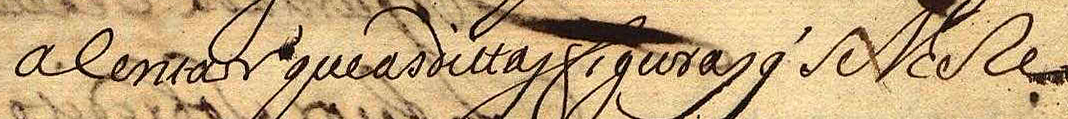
acentar que as dittas figuras q̄ se lhe Re
